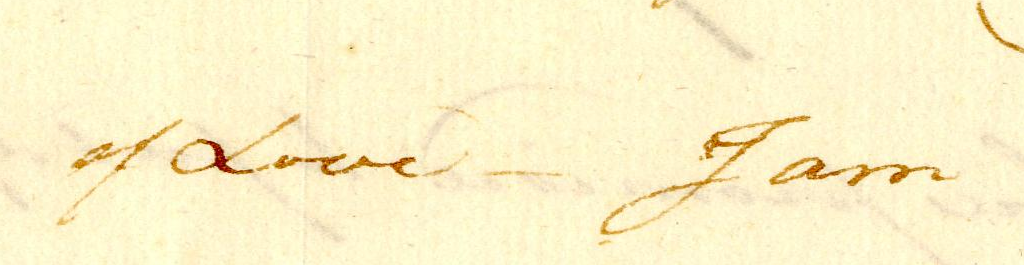of Love- I am
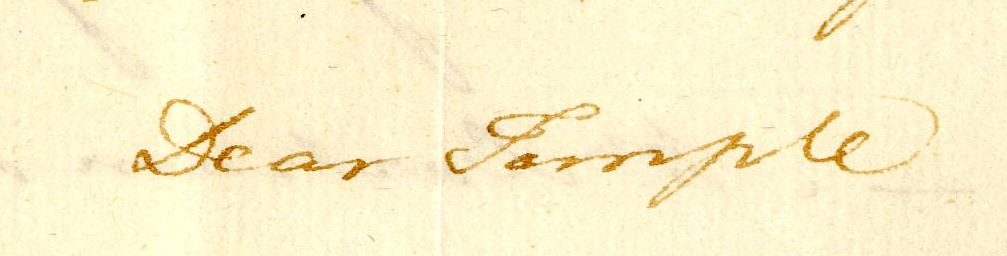Dear Temple
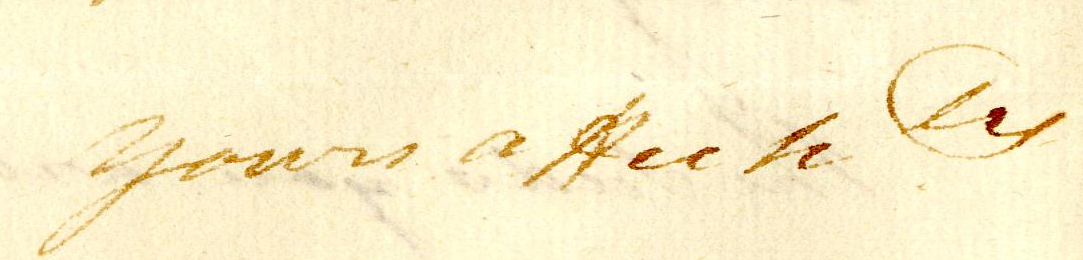Yours afecte^ly
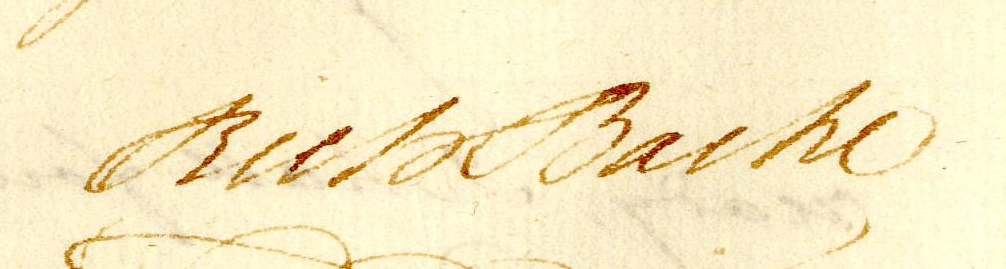Richd Bache
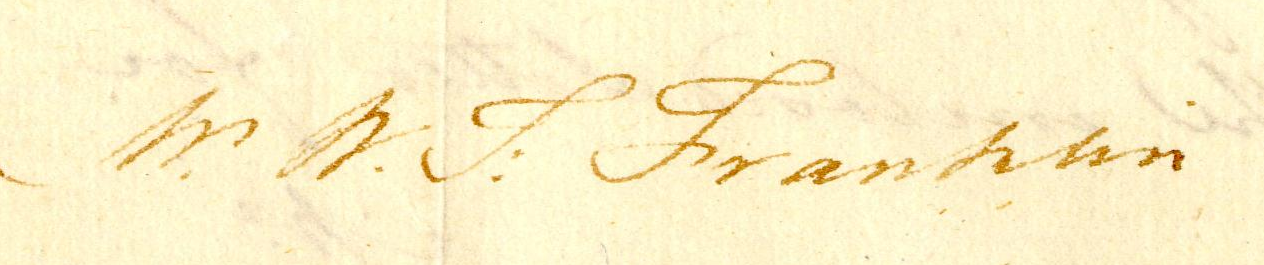M^r. W. T: Franklin
